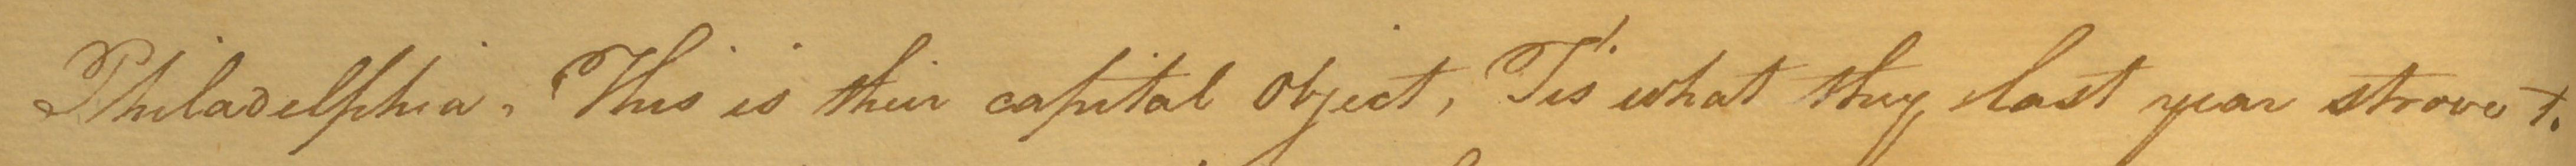Philadelphia. This is their capital Object, T'is what they last year strove to
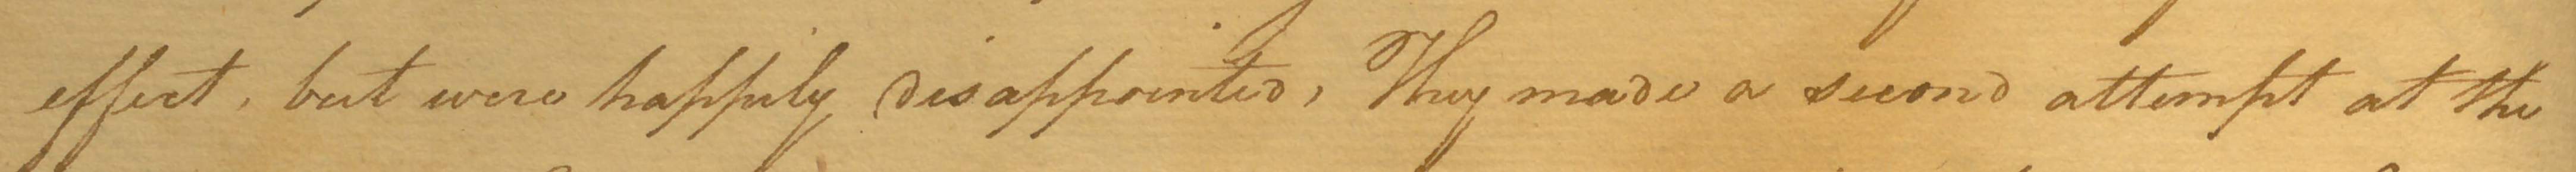effect, but were happily disappointed, They made a second attempt at the
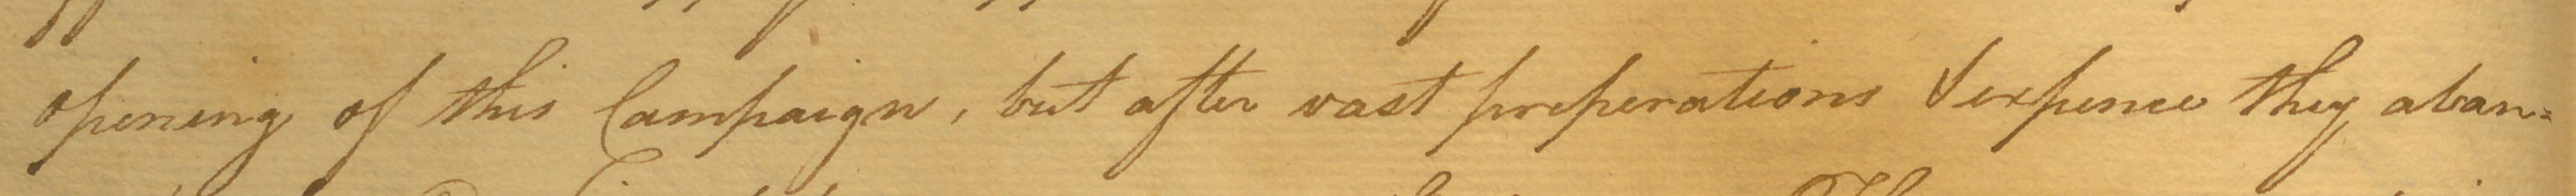opening of this Campaign, but after vast preparations & expence they aban-
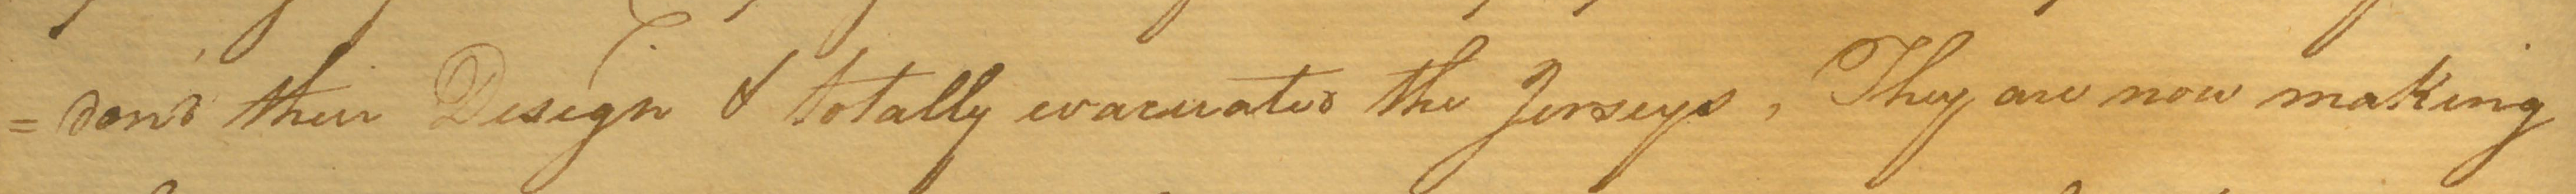-don'd their Design & totally evacuated the Jerseys. They are now making
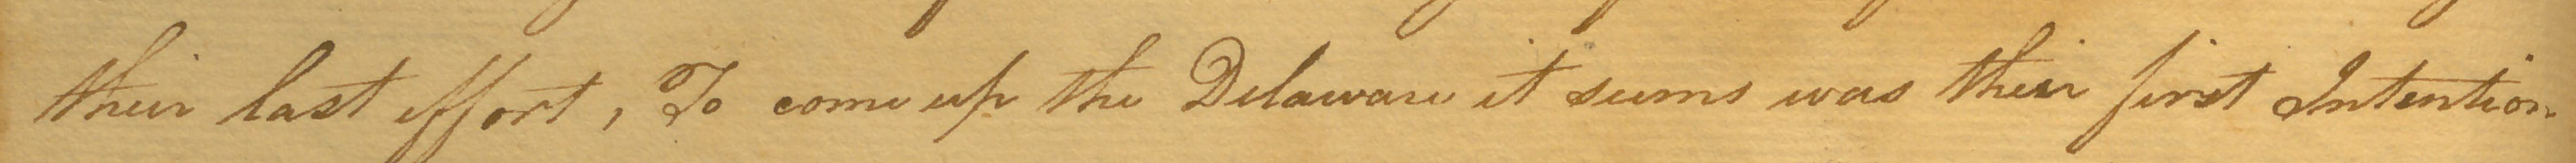their last effort, To come up the Delaware it seems was their first Intention
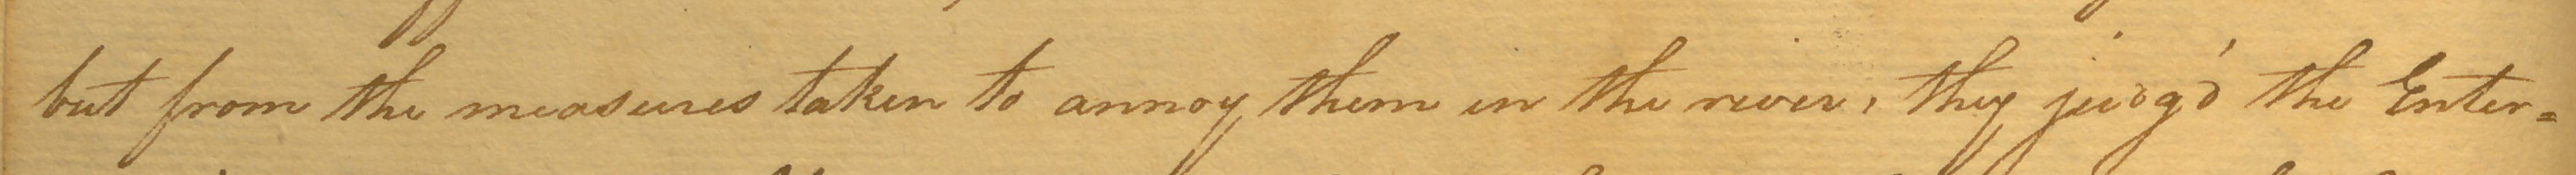but from the measures taken to annoy them in the river, they judg'd the Enter-
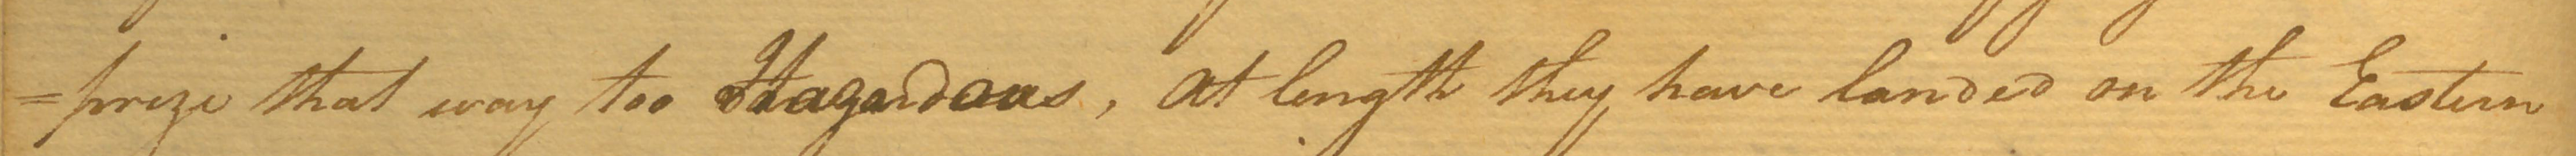-prize that way too Hazardous, At length they have landed on the Eastern
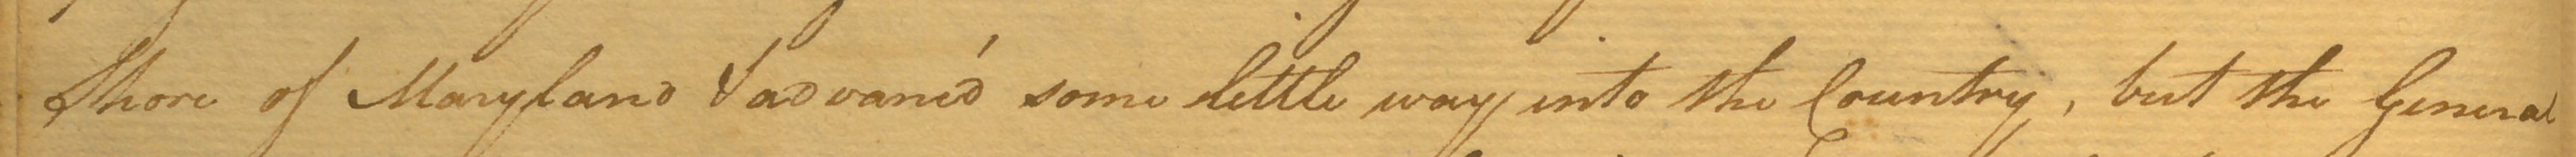Shore of Maryland & advanc'd some little way into the Country, but the General
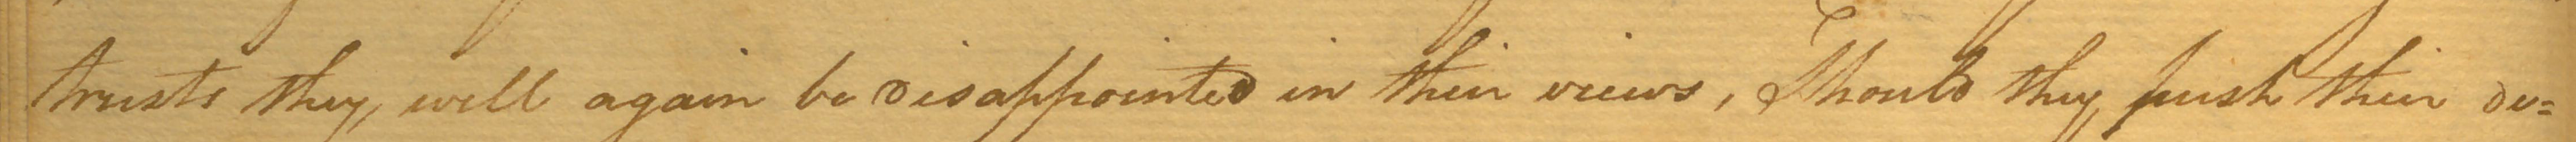trusts they will again be disappointed in their views, Should they push their de-
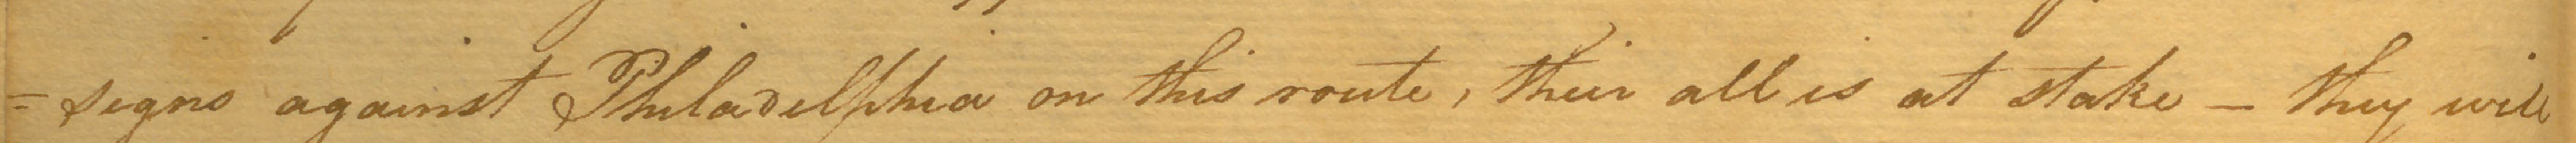-signs against Philadelphia on this route, their all is at stake- They will
